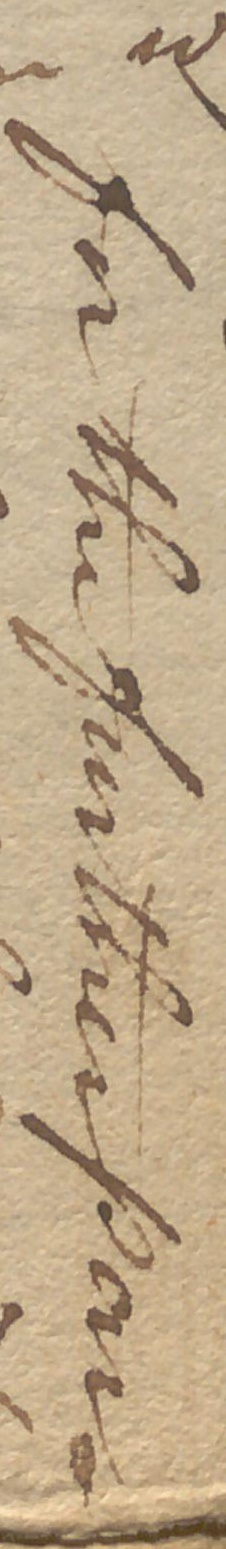for the further par
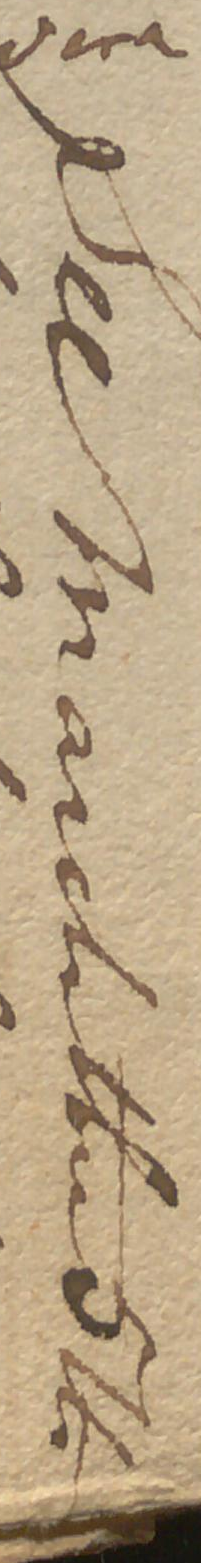See march the 5th
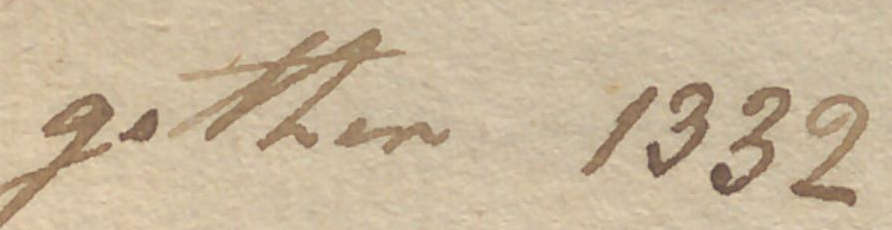gether 1332
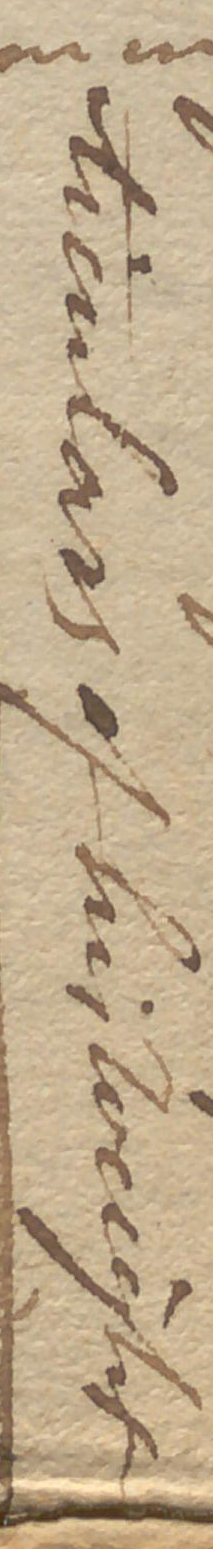ticulars of his weight
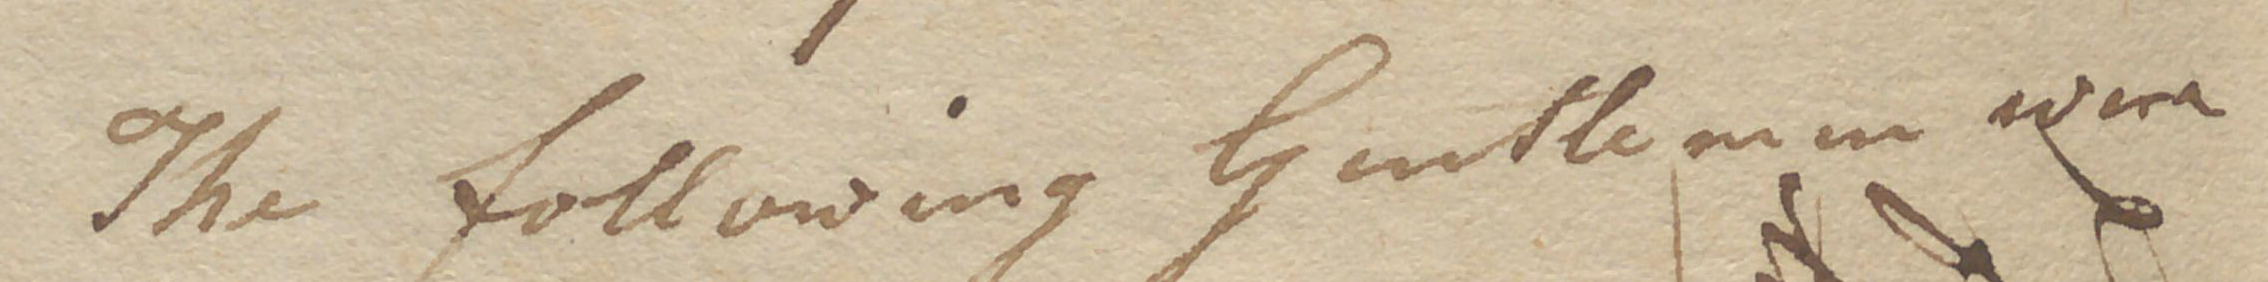The following Gentlemen were
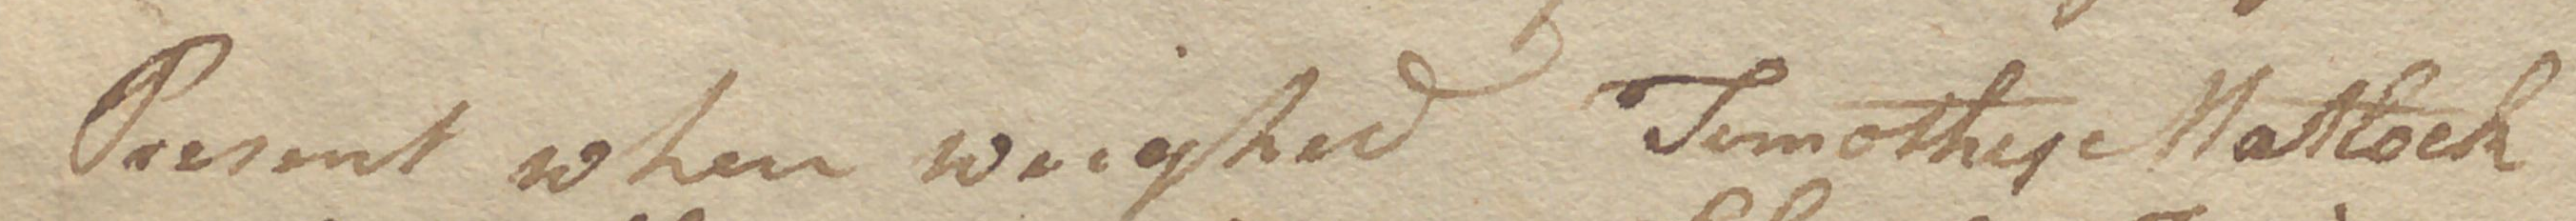Present when weighed Timothy Matlock
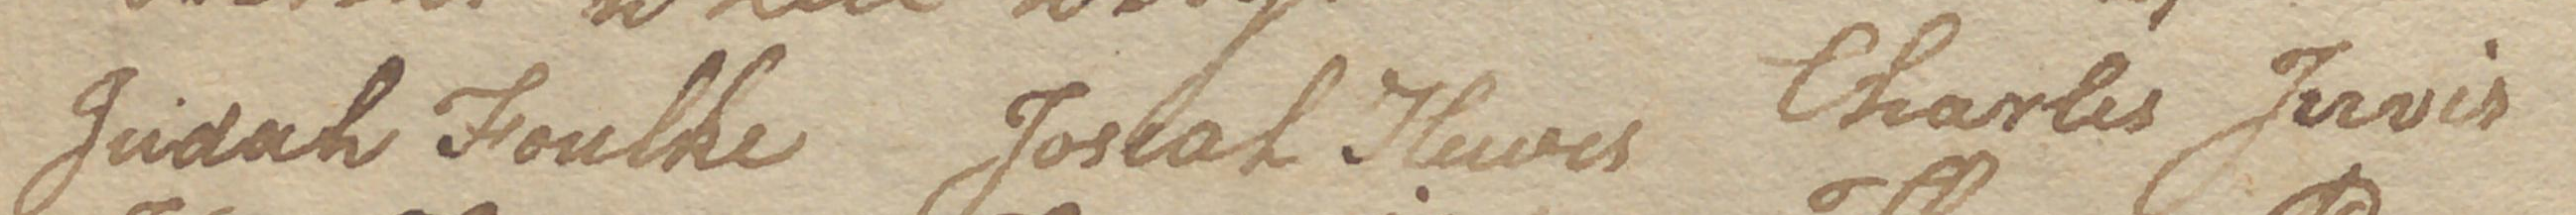Judah Foulke JosiahHewes Charles Jervis
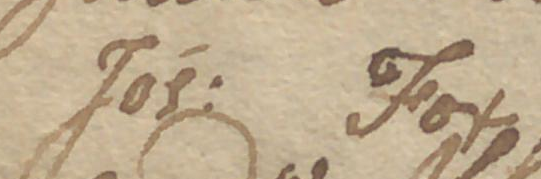Jos. Fox
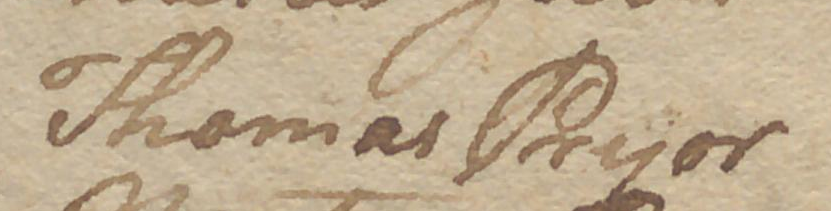Thomas Pryor
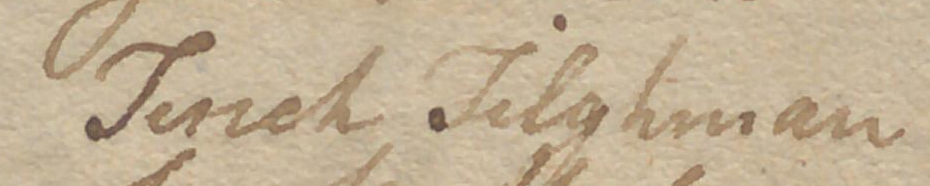Tench Tilghman
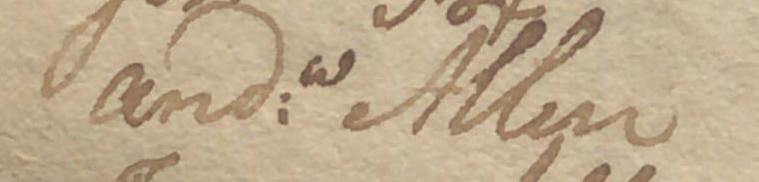and^w. Allen
